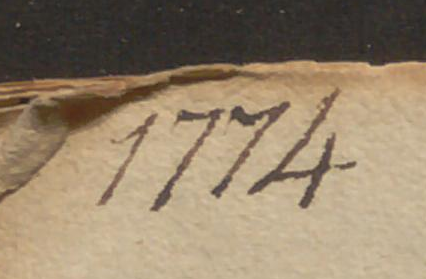1774
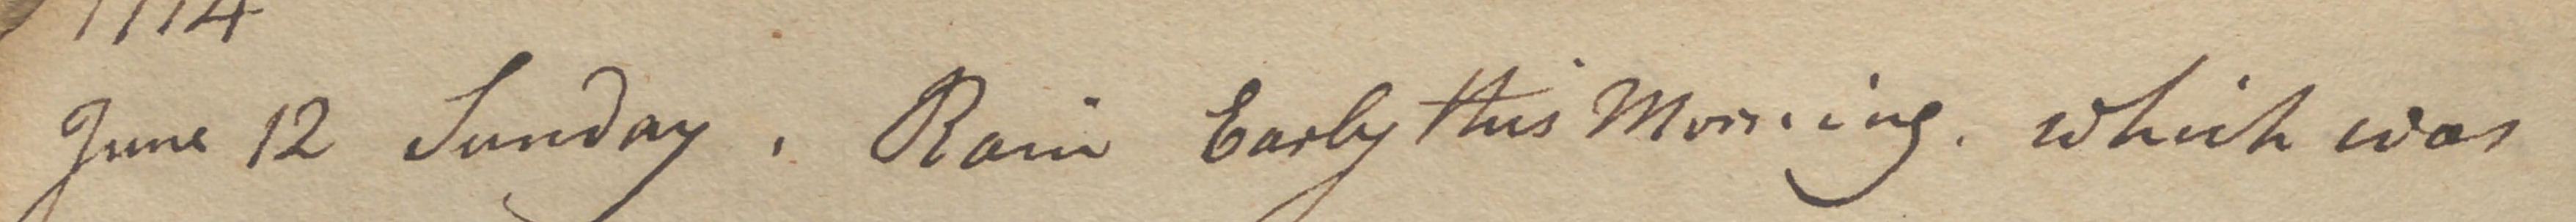June 12 Sunday. Rain Early this Morning. which was
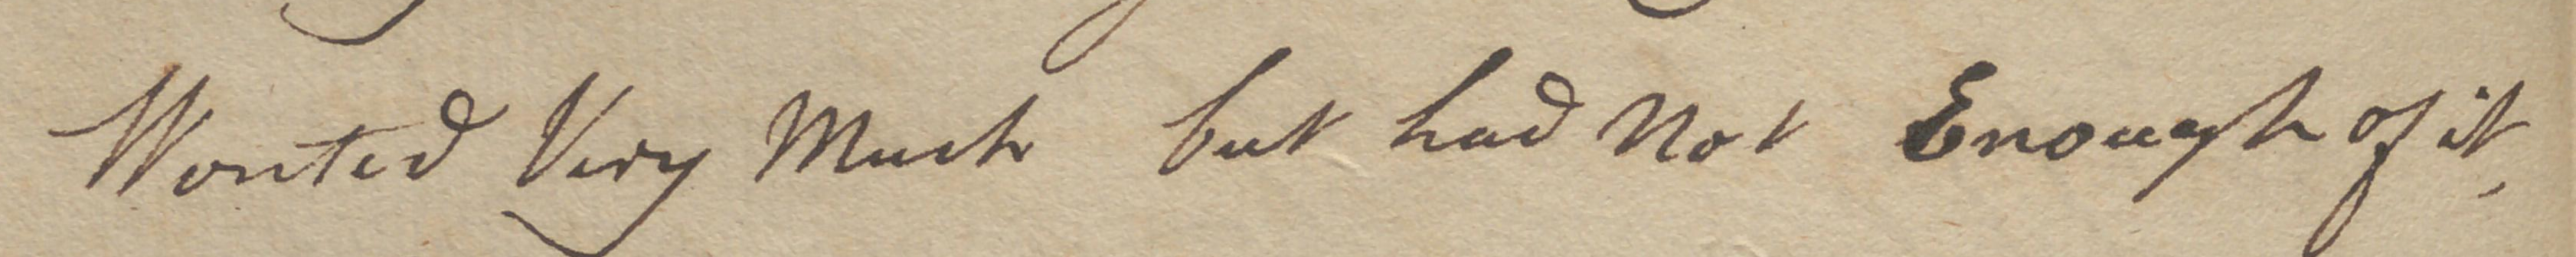Wanted Very Much but had not Enough of it
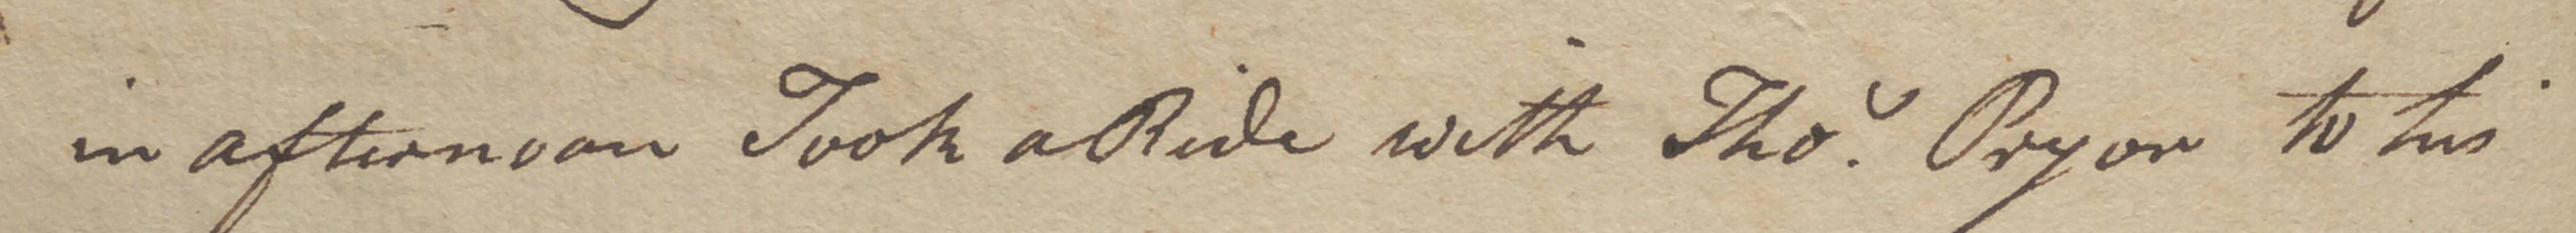in afternoon Took a Ride with Tho^s. Pryor to his
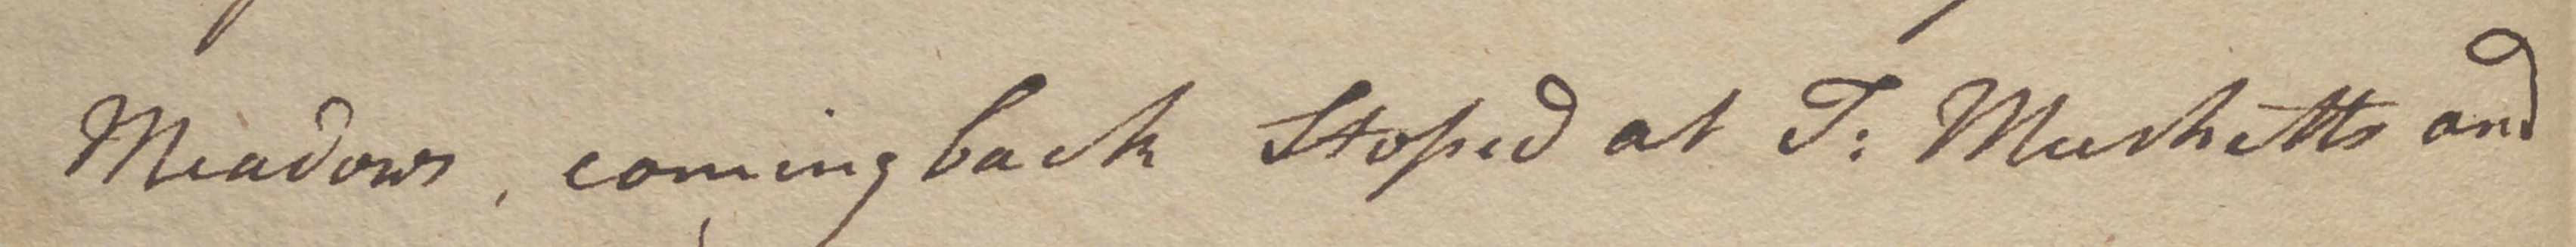Meadows, coming back stoped at T: Mushetts and
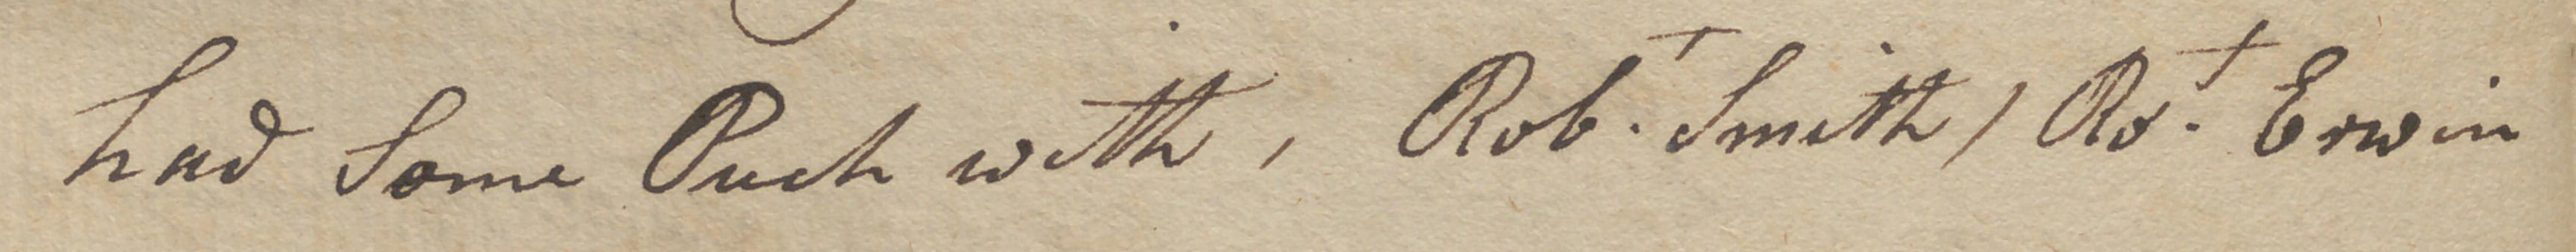had Some Puch with, Rob^t. Smith, Ro^t. Erwin
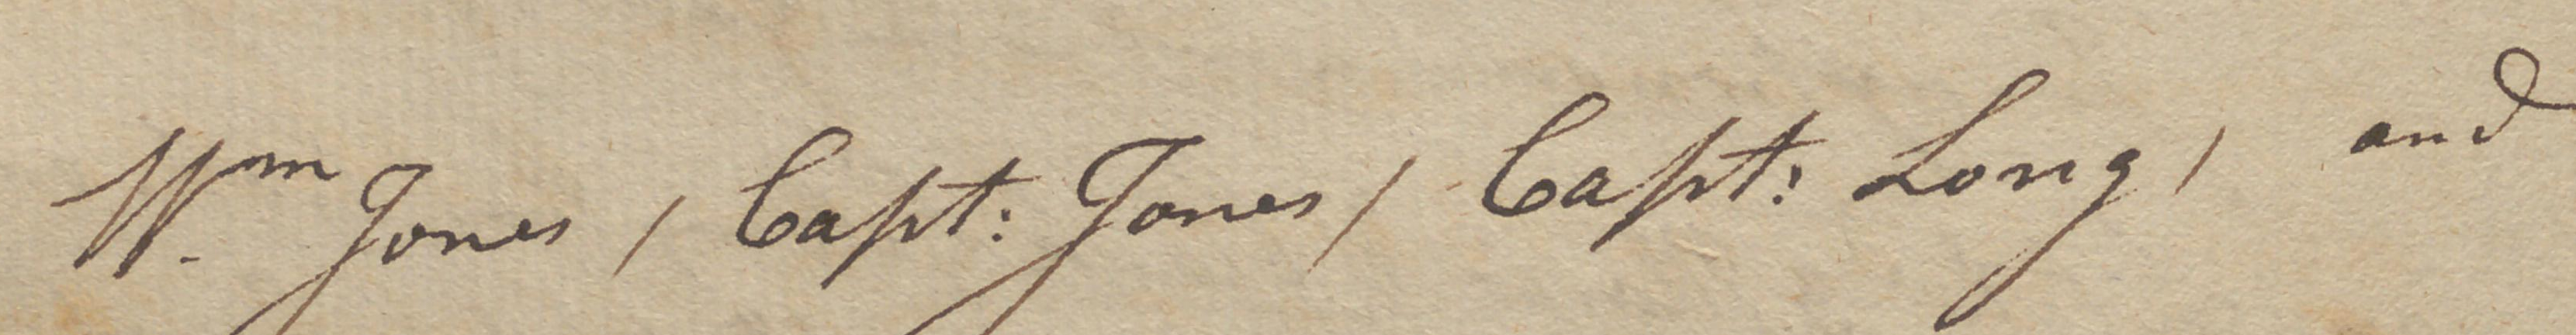W^m. Jones, Capt. Jones, Capt^. Long, and
